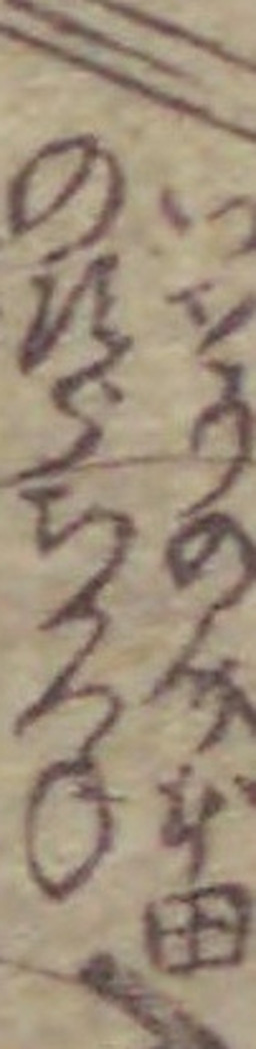の次郎ちかつね
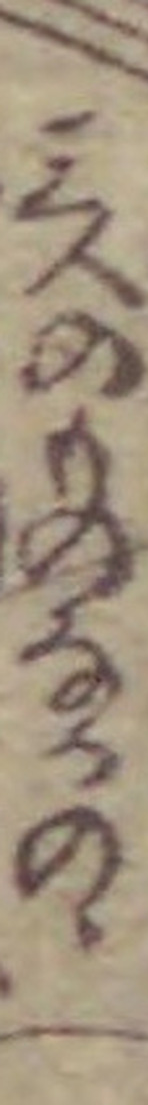三人のものなかのゝ
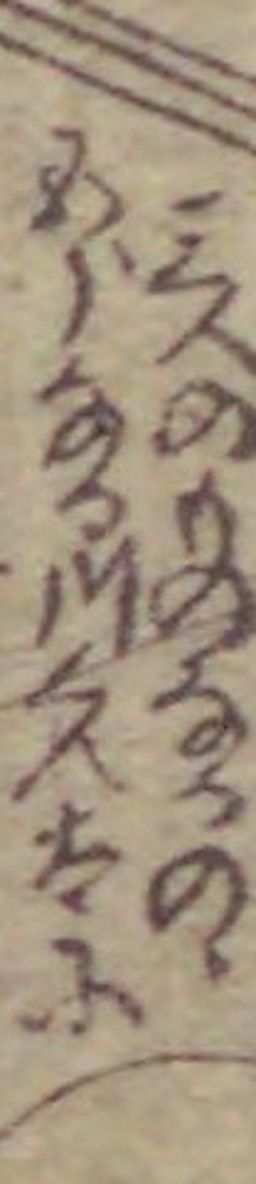五郎なか川久太に
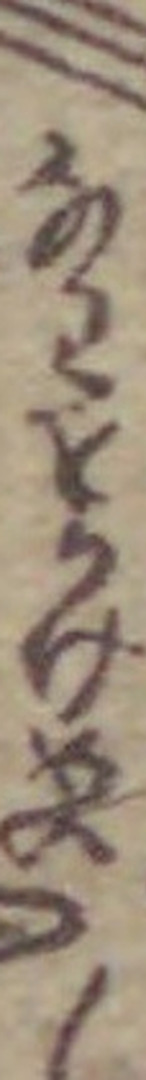なわをかけ草〳〵
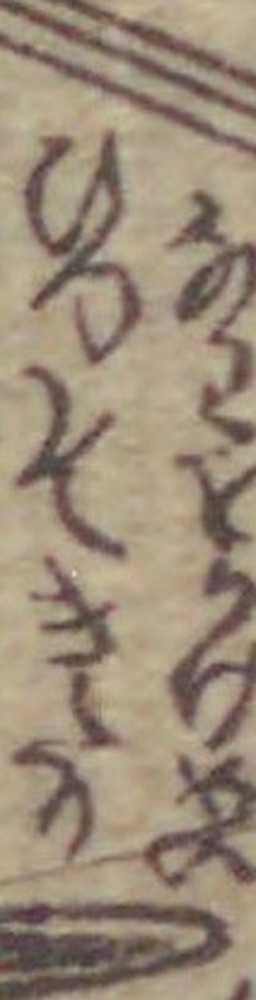ひつたてきたり
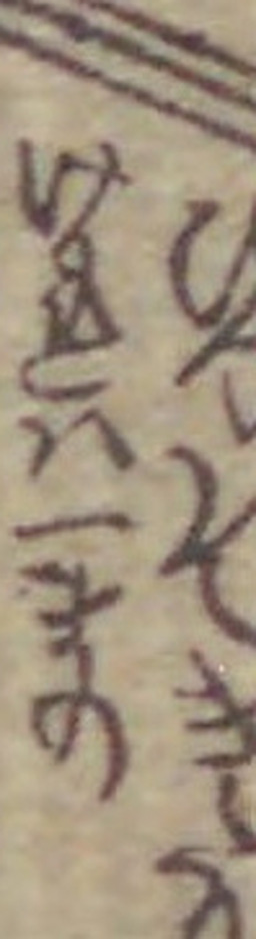けれは一まの
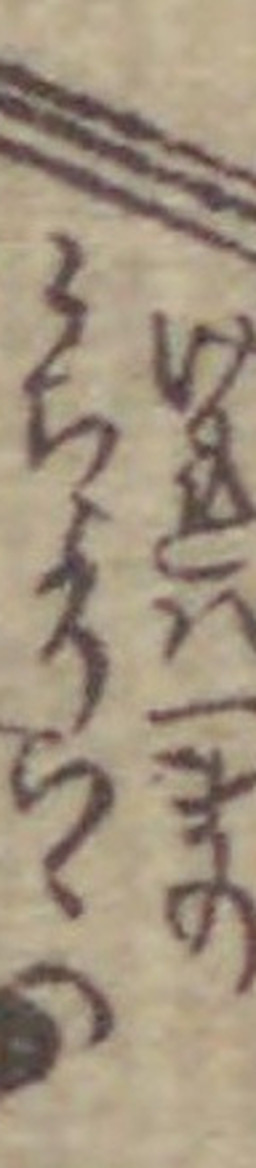うちよりちゝ
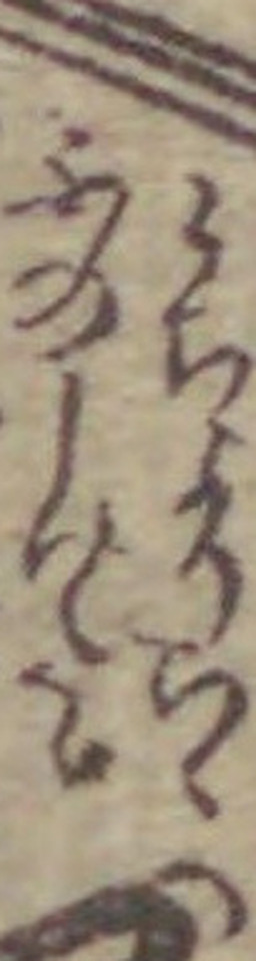ふのしけたゞ
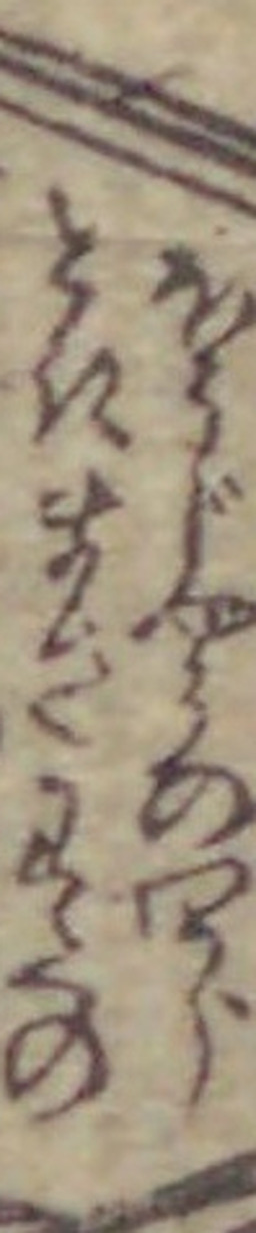ときまさわたの
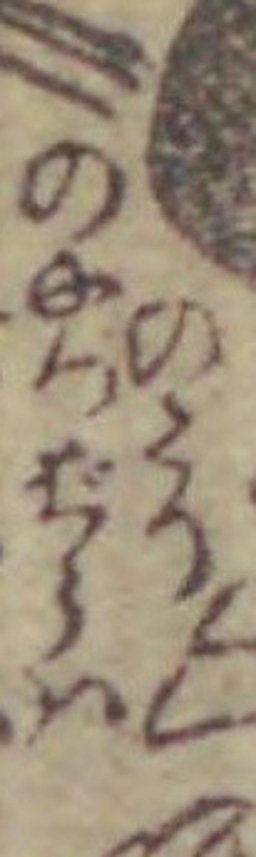のやつばらは
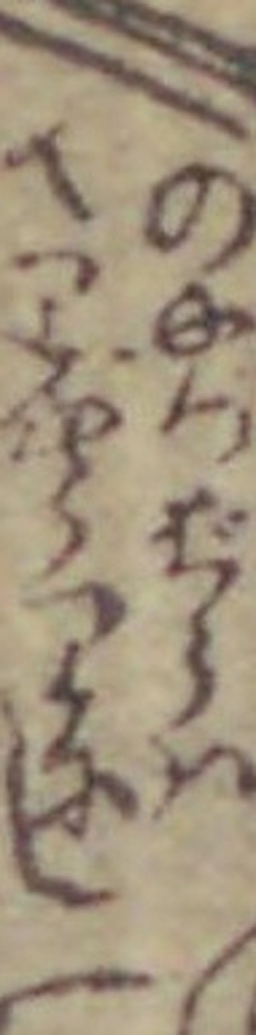てりやうりにし
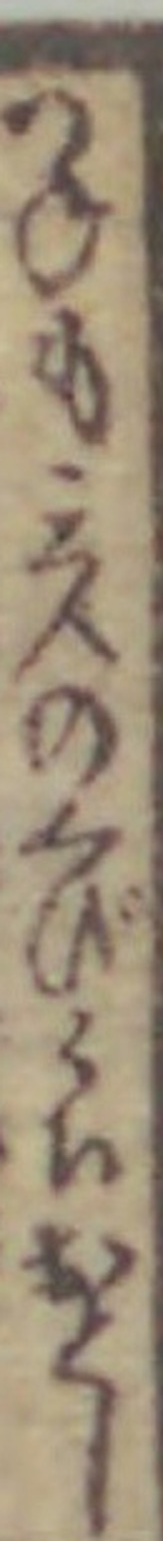つねも三人のくびうちおとし
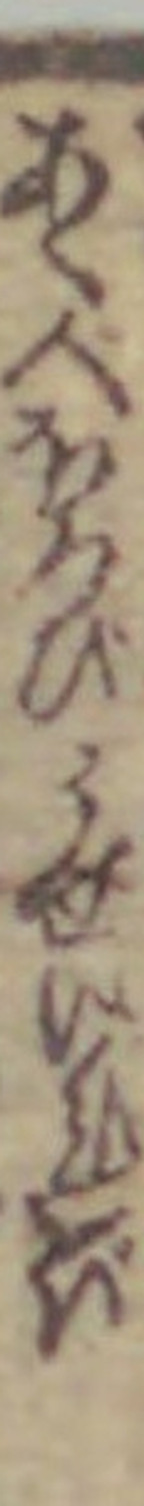あく人ほろびうせければ
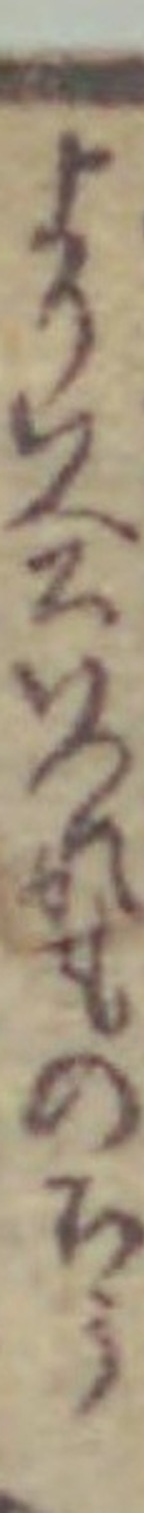よりいへ公いつれものちう
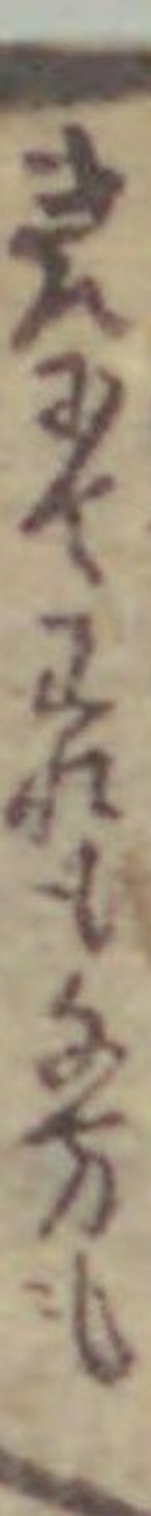きんにてわれも千万も
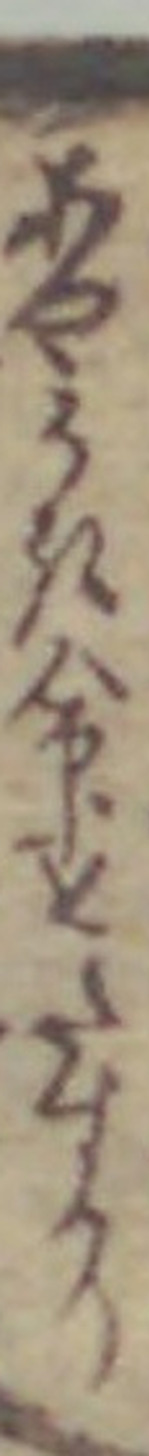あやうき命をたすかり
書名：鎌倉山紅葉浮名
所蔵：国立国会図書館 National Diet Library, JAPAN
